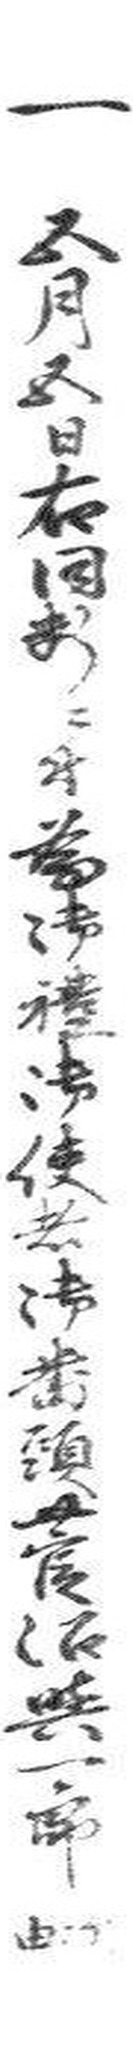一五月五日右同断ニ付為御礼御使者御番頭菅沼与一郎次由
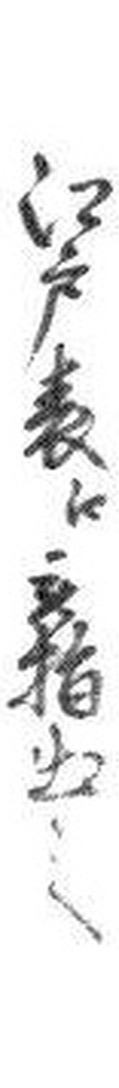江戸表江被指出之
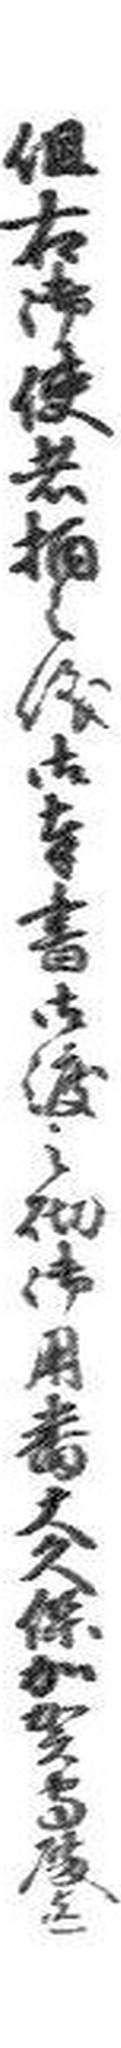但右御使者柄之儀御奉書御渡之砌御用番大久保加賀守殿迄
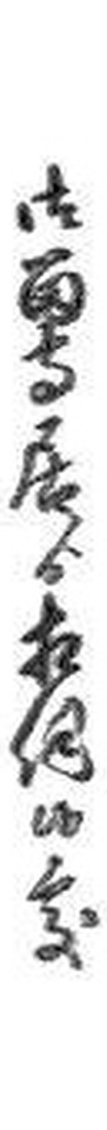御留守居ゟ相伺候処
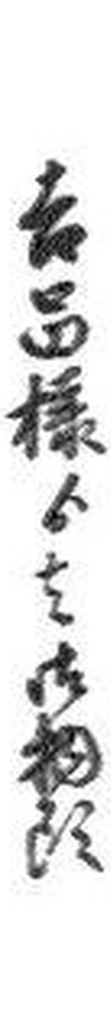吉品様ゟ者御物頭
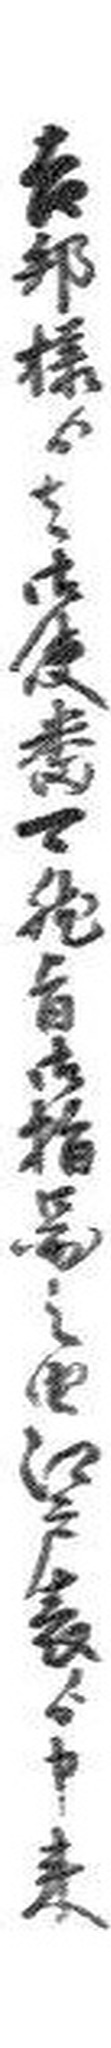吉邦様ゟ者御使番可然旨御指図之由江戸表ゟ申来
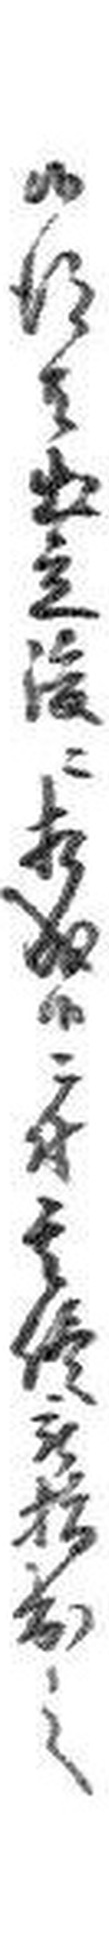候得共出立後ニ相成候ニ付其儘被指出之
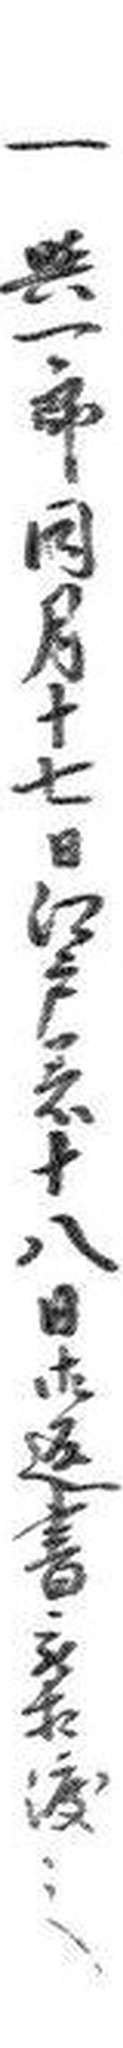一与一郎同月十七日江戸着十八日御返書被相渡之
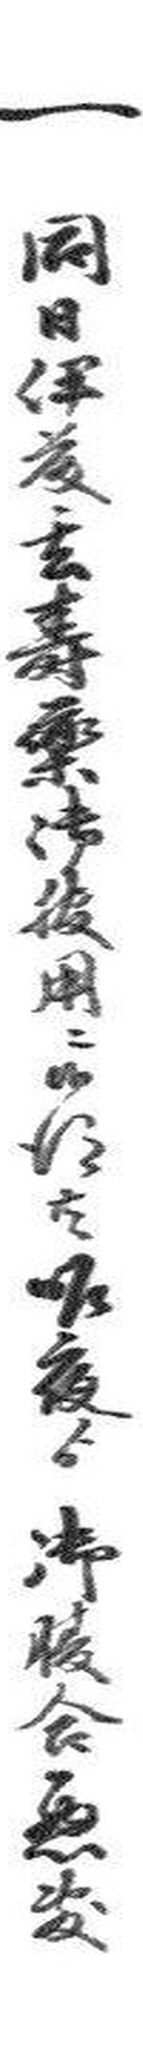一同日伊藤玄寿薬御服用ニ候得共昨夜ゟ御腹合悪敷
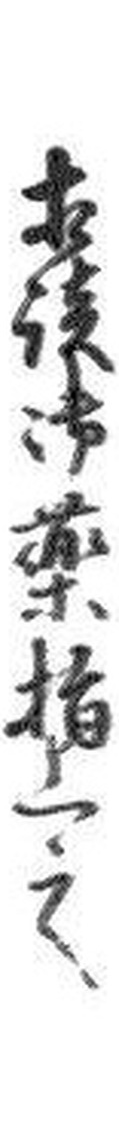相談御薬指上之

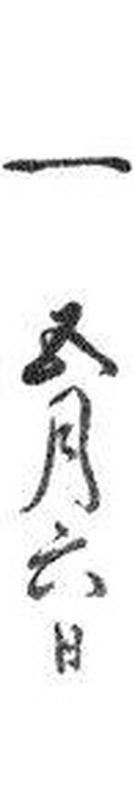一五月六日
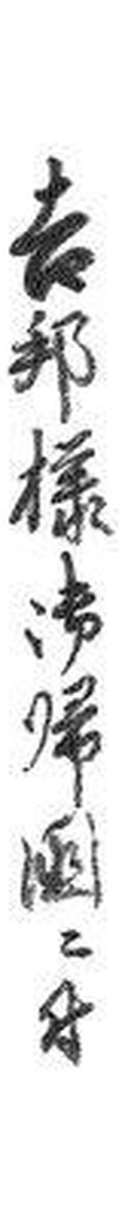吉邦様御帰国ニ付
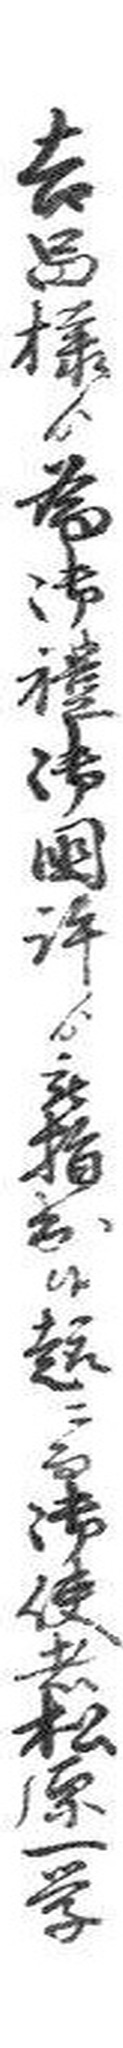吉品様ゟ為御礼御国許ゟ被指出候趣ニ而御使者松原一学
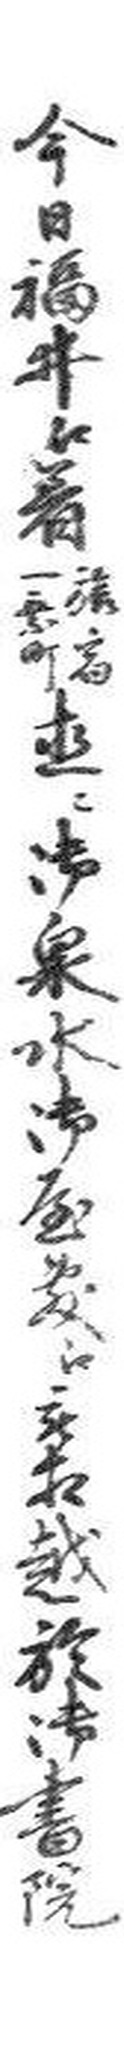今日福井江着旅宿一乗町直ニ御泉水御屋敷江被相越於御書院
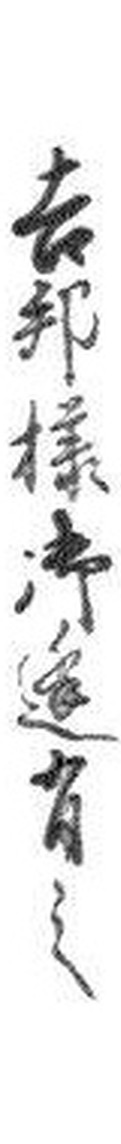吉邦様御逢有之
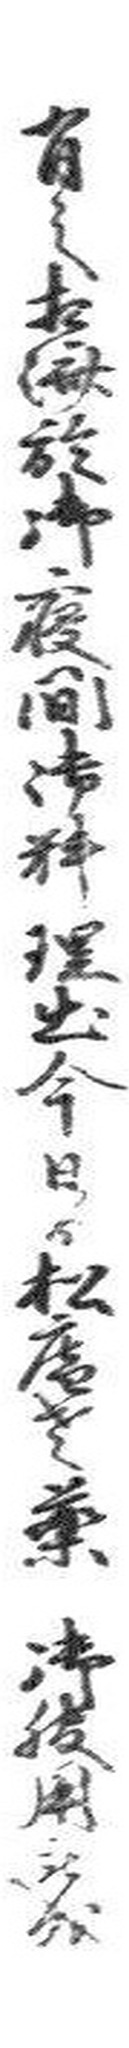有之相済於御寝間御料理出今日ゟ松庵老薬御服用被成
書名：家譜 二十六 吉品公 従宝永七年到正徳二年
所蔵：福井県文書館 Fukui Prefectural Archives
